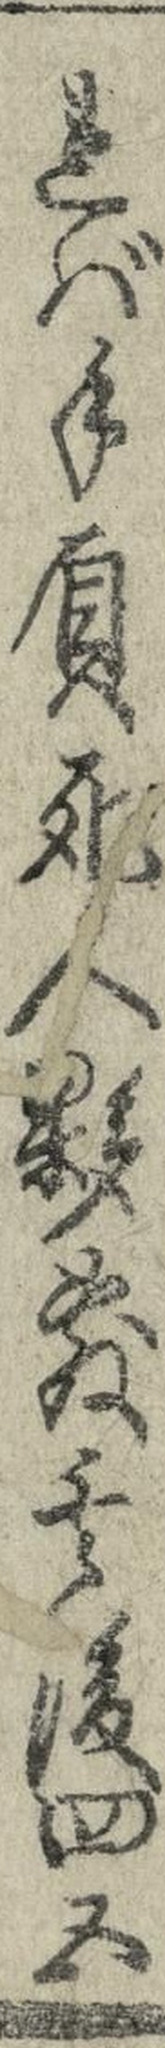れば手負死人夥敷其後四五
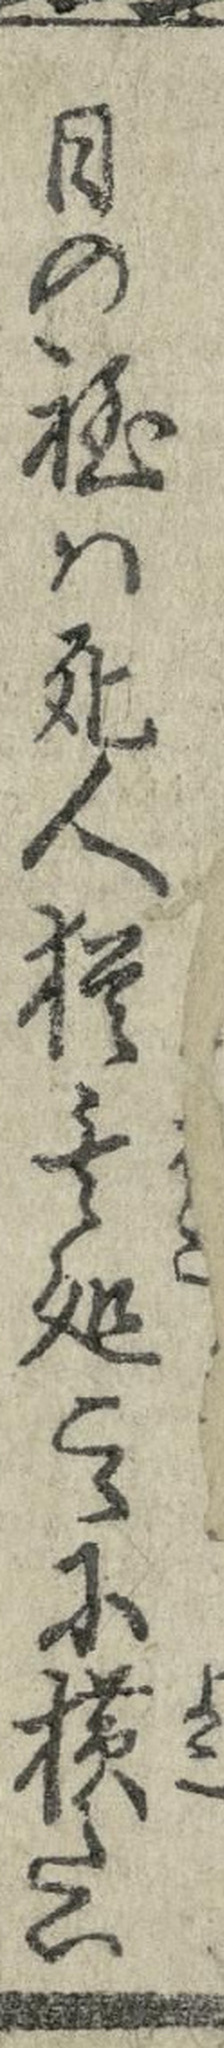日の程は死人猶其処こゝに横たは
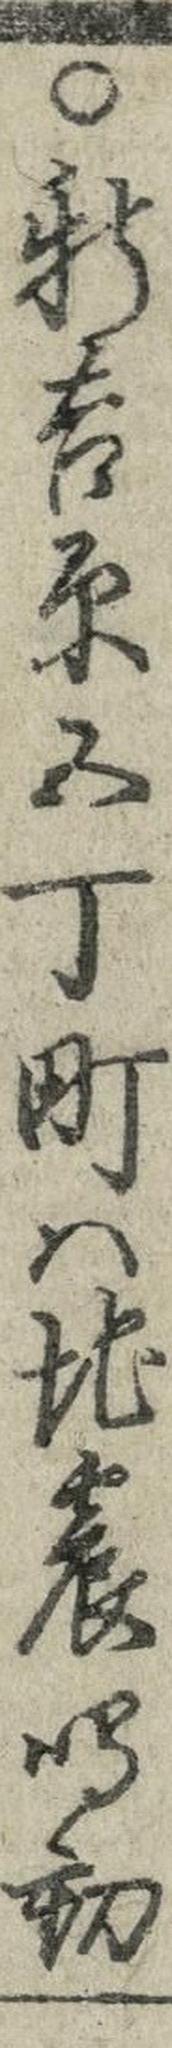○新吉原五丁町は地震鳴動
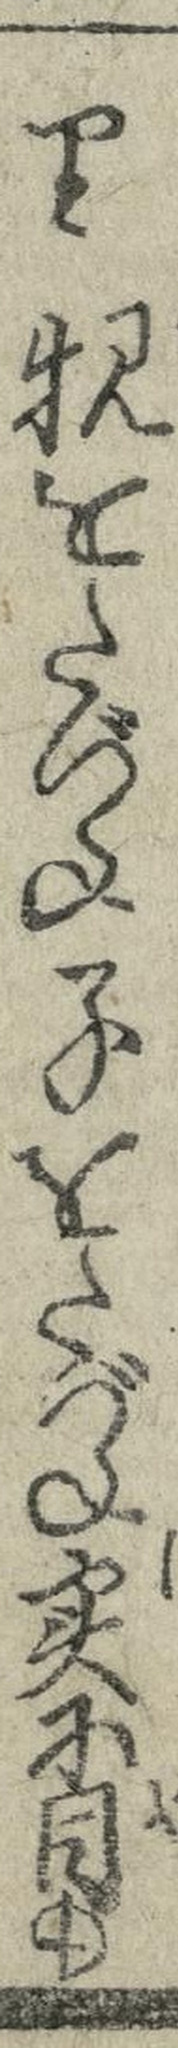り親をたづね子をたづね実に目も
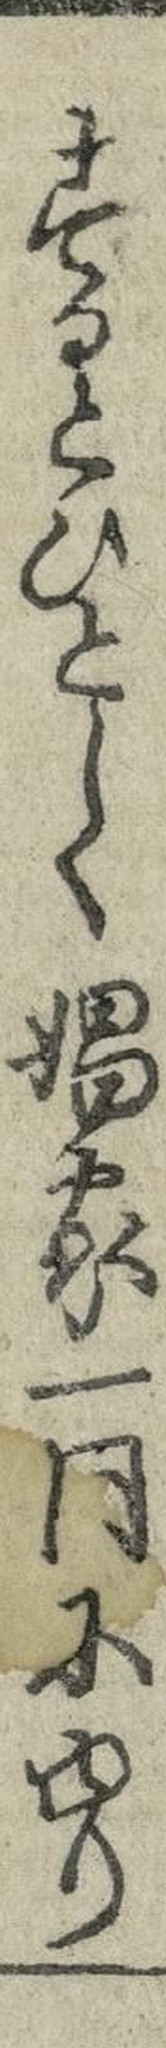するとひとしく娼家一円にゆり
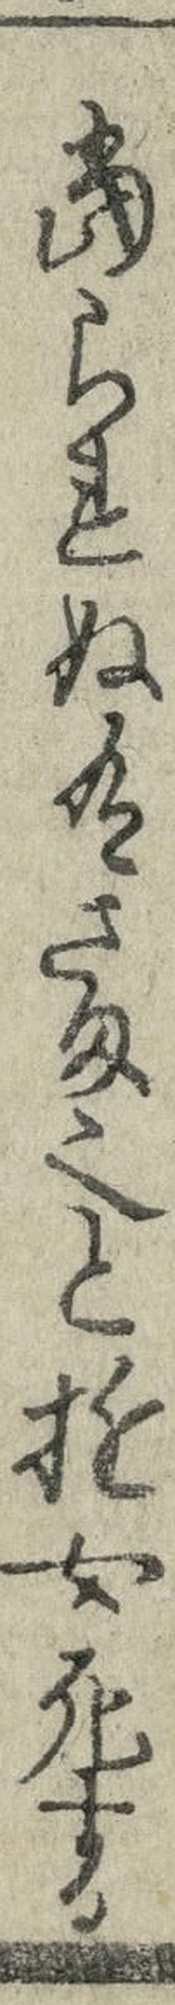当られぬ有さま也こと遊女死する
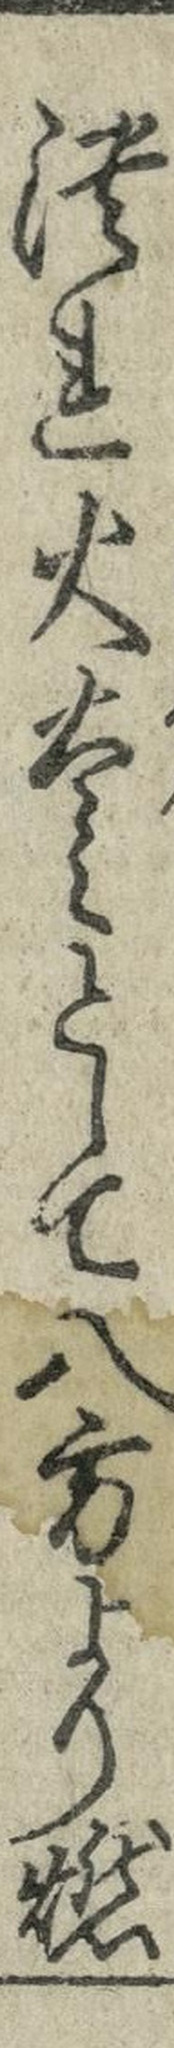潰れ火炎々として八方より燃
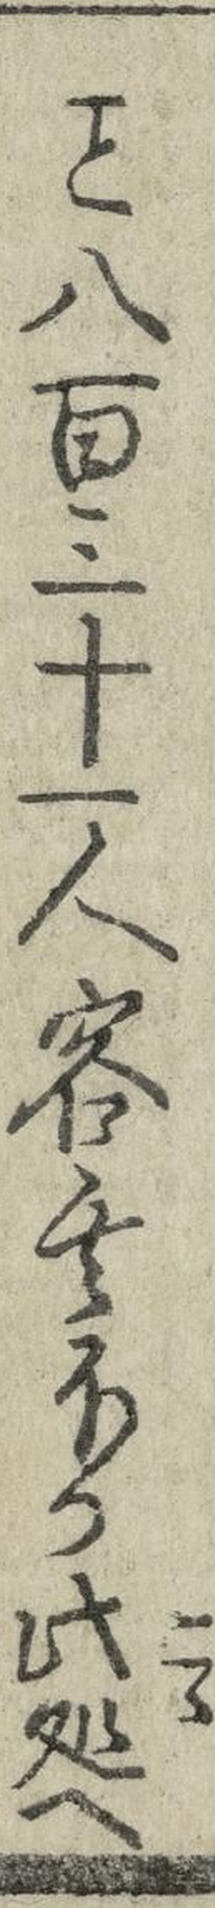こと八百三十一人客其ほか此処へ
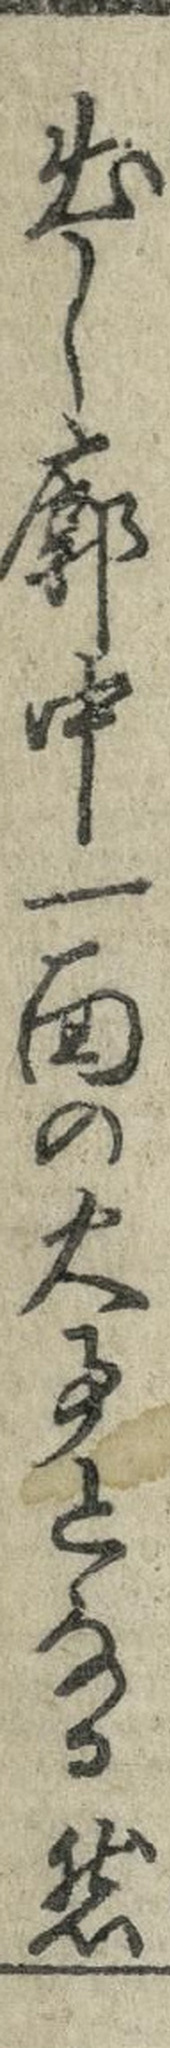出し廓中一面の火事となる然
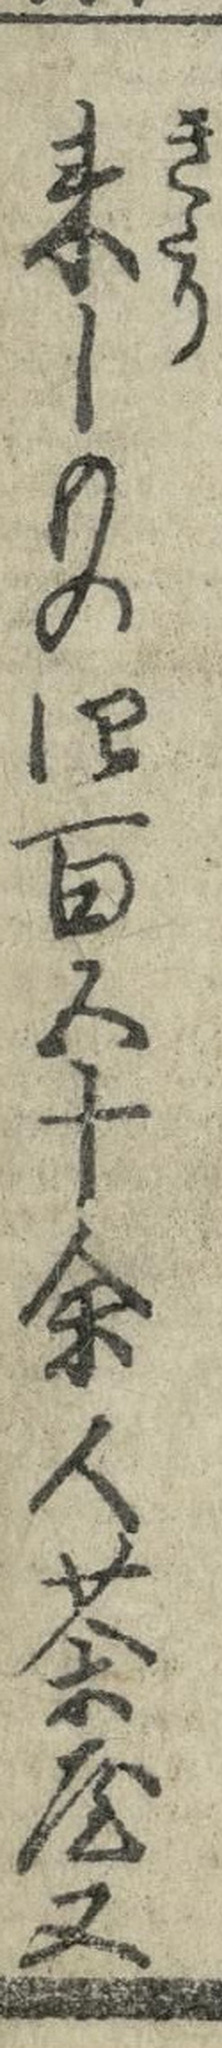来しもの四百五十人余人茶屋又
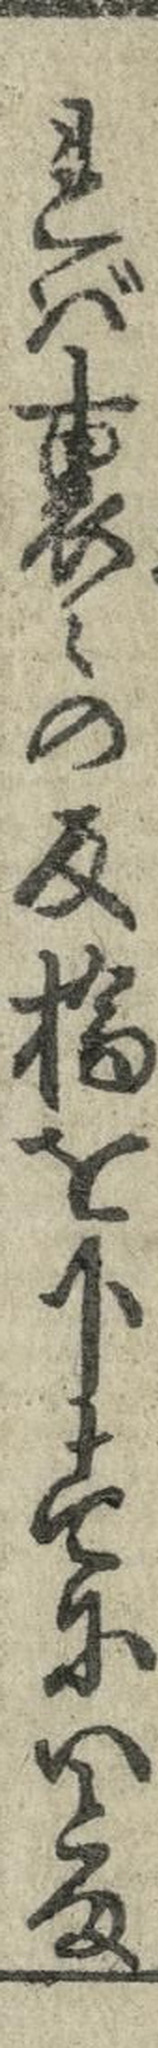れば裏々の反橋を下すにいとま
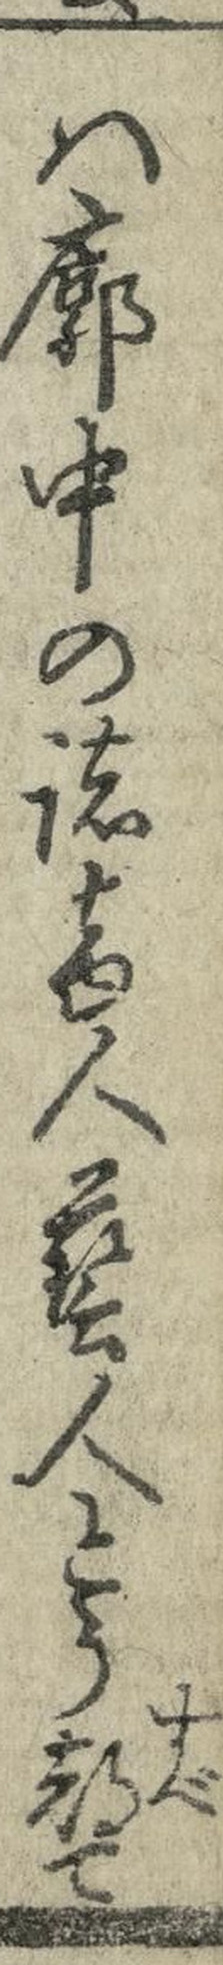は廓中の諸商人芸人とう都て
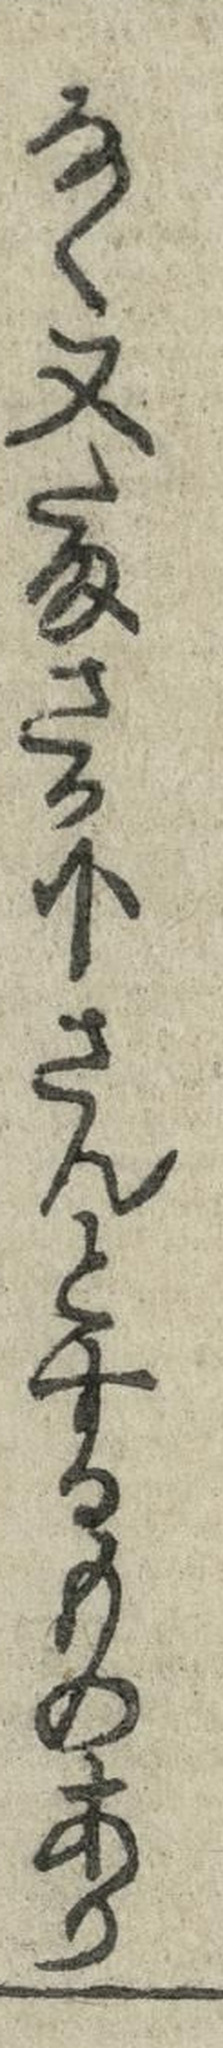なく又たまさか下さんとするものあり
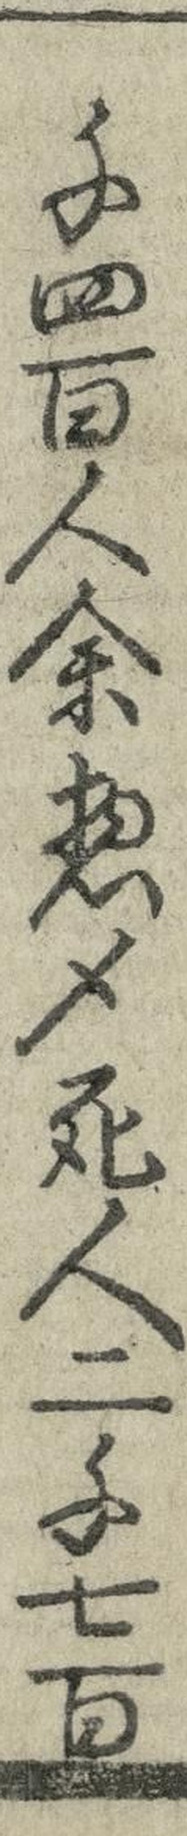千四百人余惣〆死人二千七百
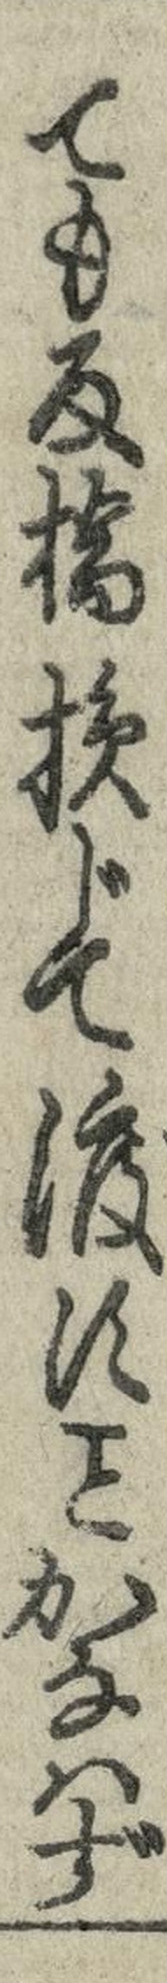ても反橋損じて渡すことかなはず
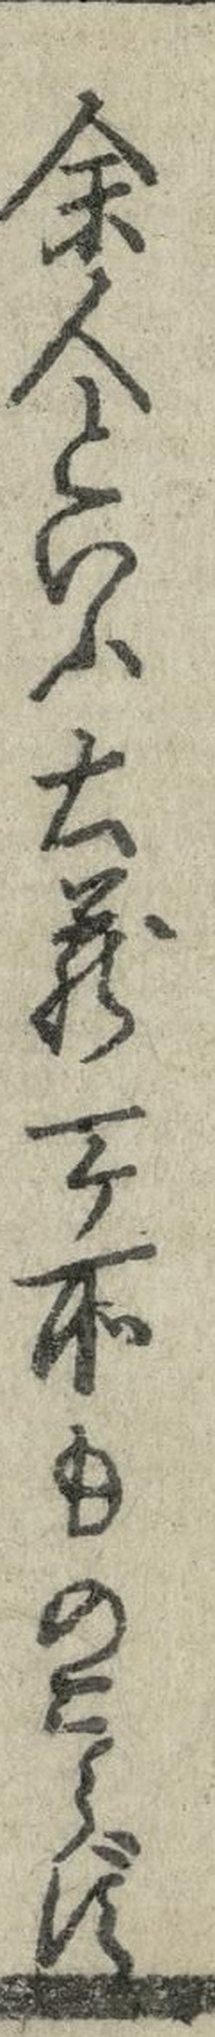余人といふ土蔵一ヶ所ものこらず
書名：江戸　大地震末代噺の種　全
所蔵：東京大学地震研究所図書室 Earthquake Research Institute Library, The University of Tokyo, JAPAN
